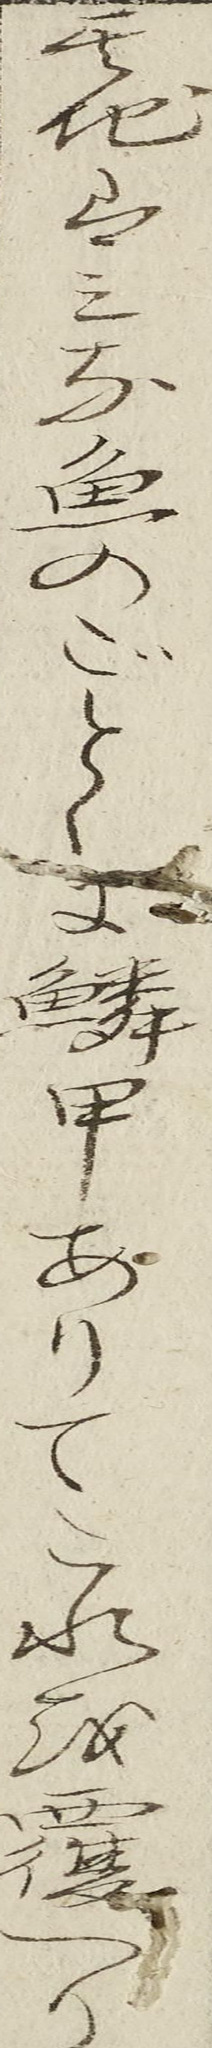其他はミな魚のごとくに鱗甲ありてこれを覆つり
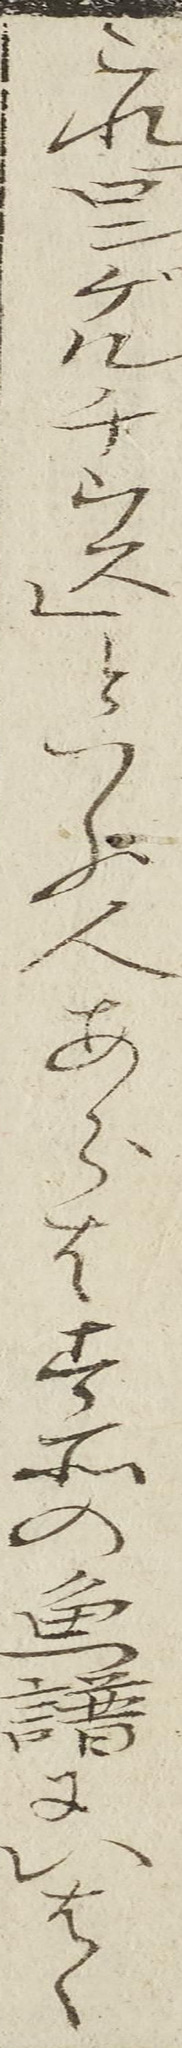これ[ロンゲルチウス」といふ人あらはす所の魚譜にいはく
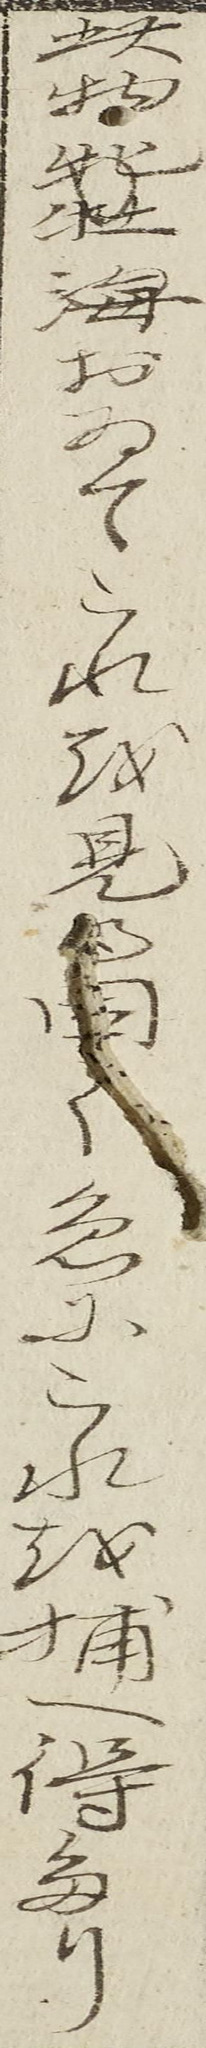此物牝牡海おゐてこれを見る因て急にこれを捕へ得たり

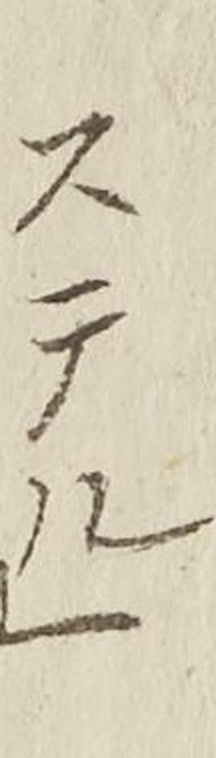ステル」
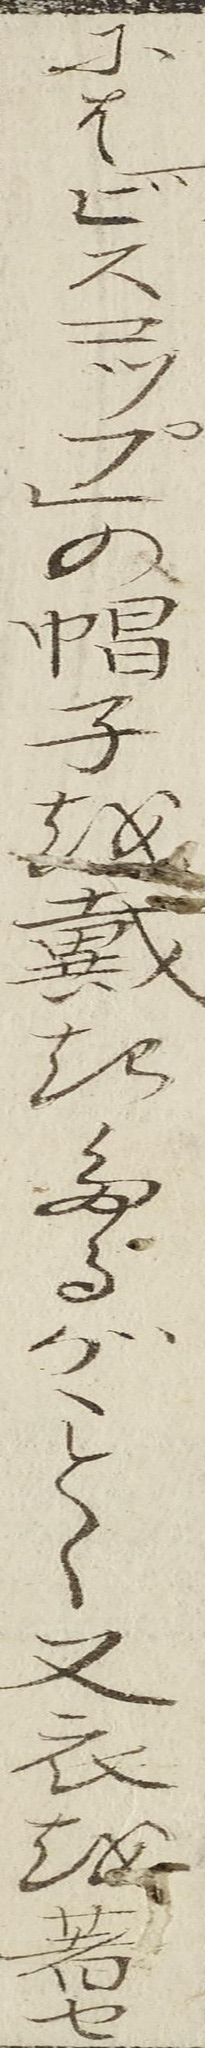には「ビスコップ」の帽子を戴きたるがことく又衣を著せ
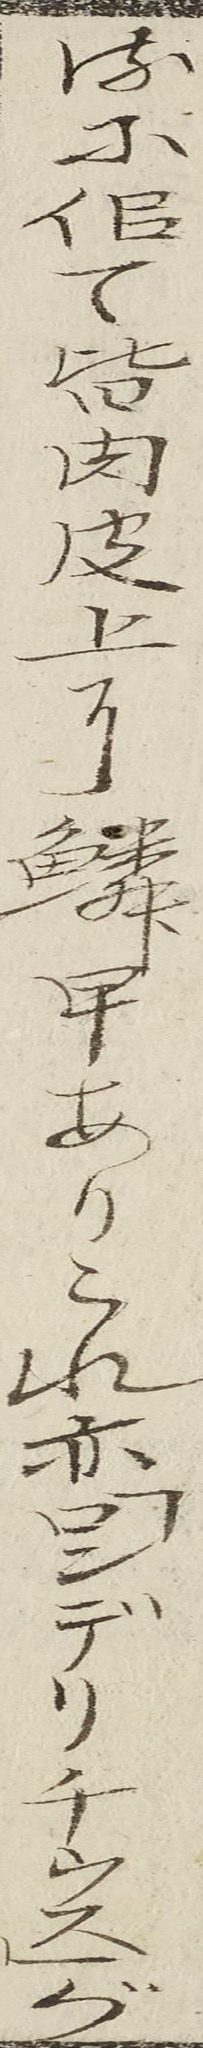るに侶て皆内皮上に鱗甲ありこれ亦「ロンデリチウス」が
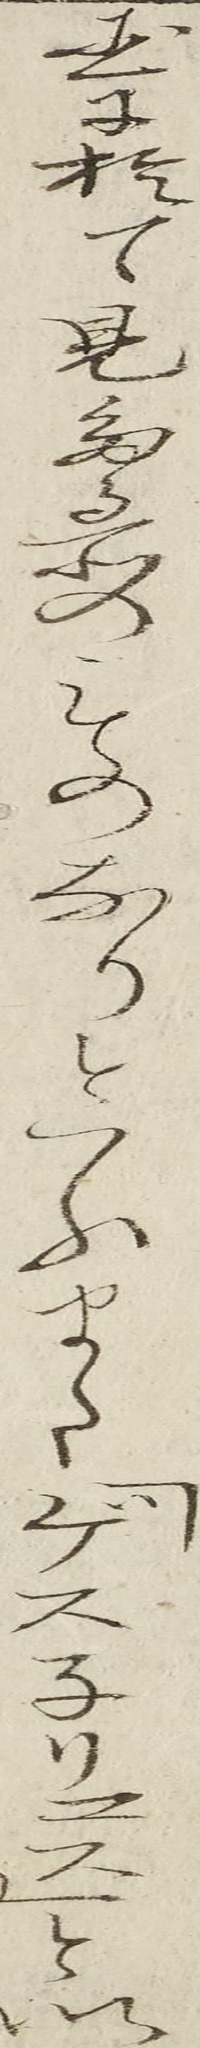国に於て見たる所のものなりといふまた「ゲス子リュス」とい
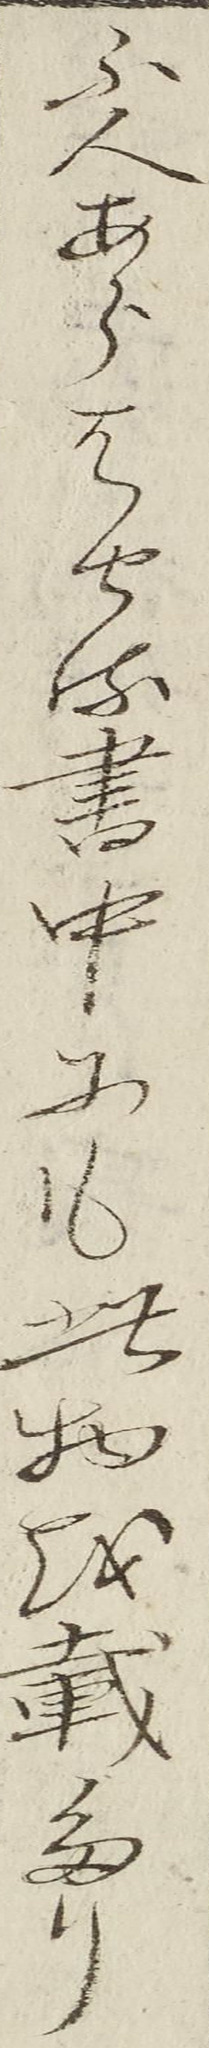ふ人あらはせる書中にも此物を載たり

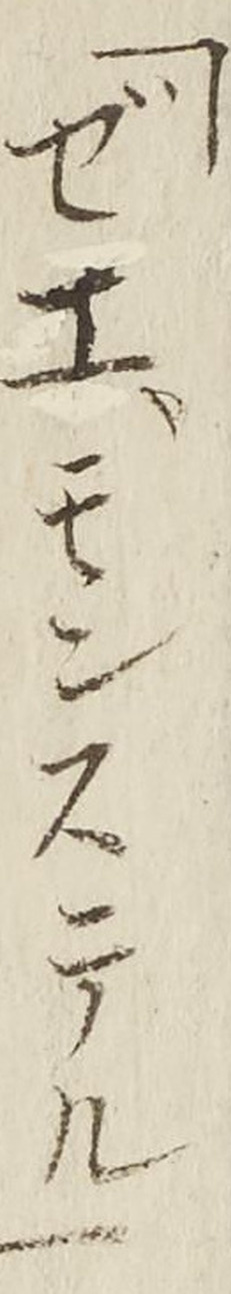「ゼエ〃モンステル」
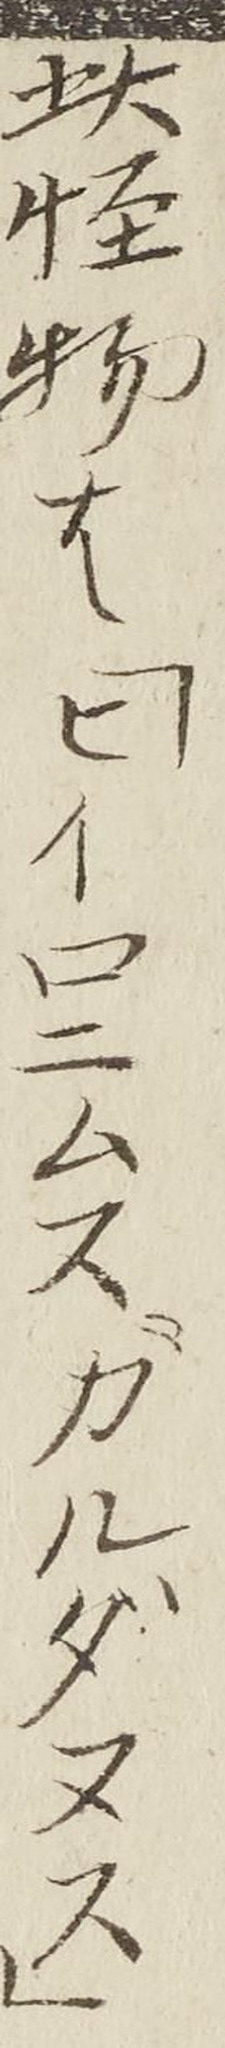此怪物は「ヒイロニムス〃カルダヌス」
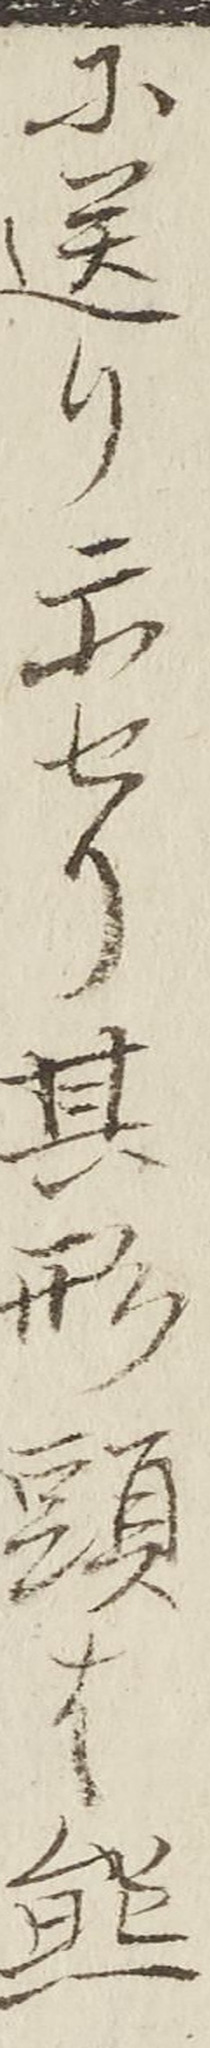に送り示せり其形頭は熊
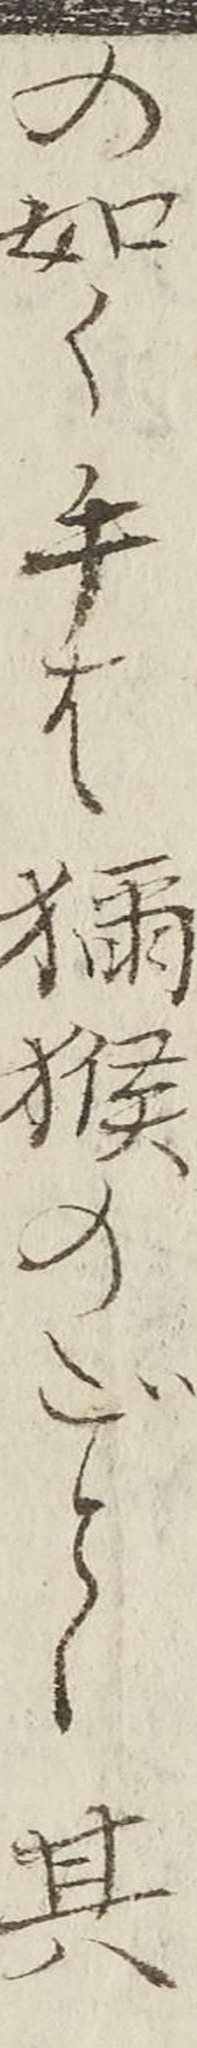の如く手は獮猴のごとく其
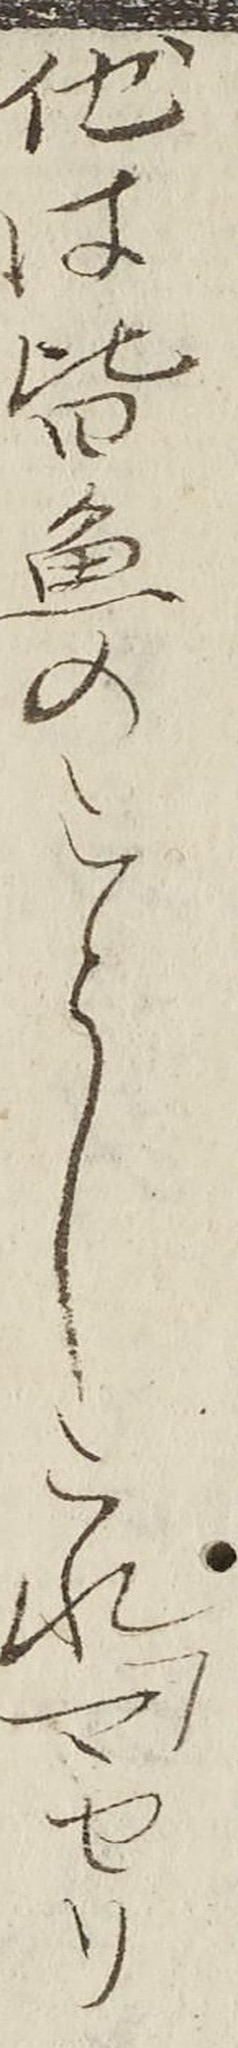他は皆魚のことしこれ「マセリ
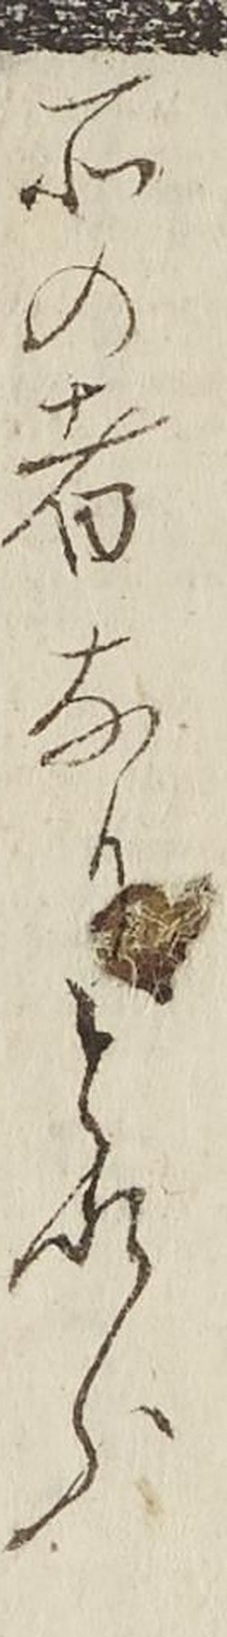所の者なりといふ
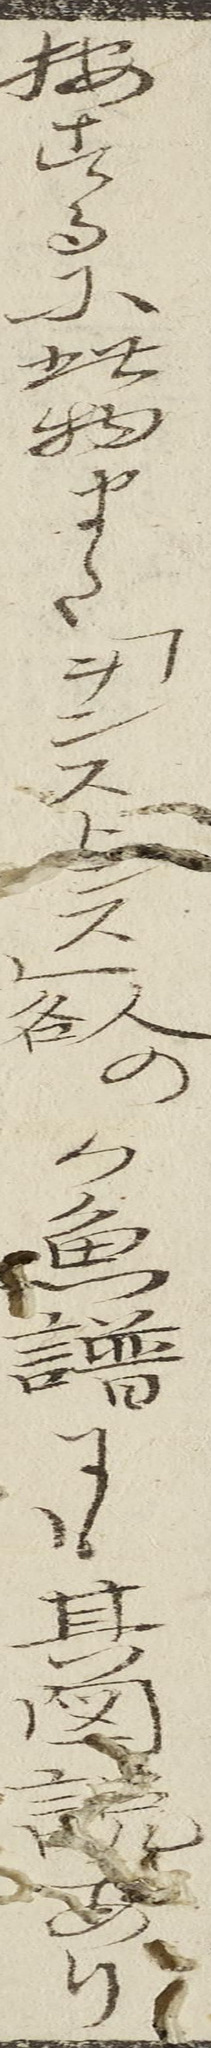按するに此物また「ヲンスㇳンス」人の名か魚譜にも其図説あり
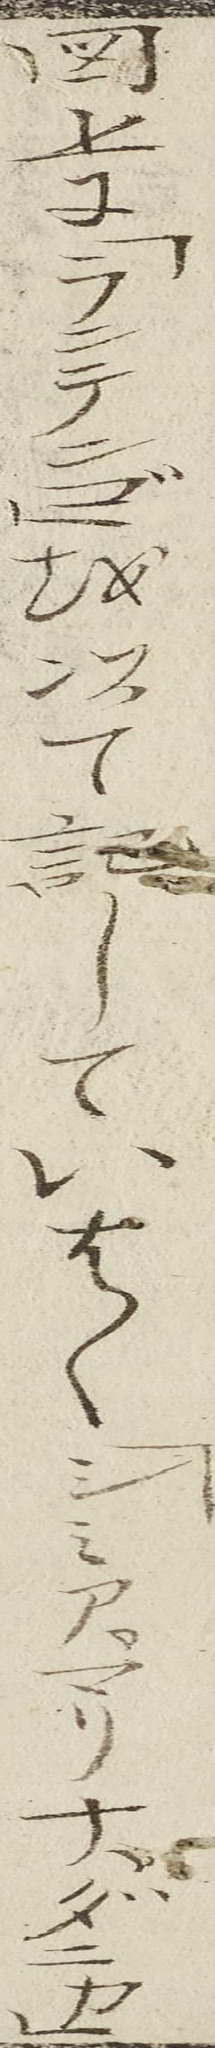図上に「ランテンンゴ」を以て記していはく「シミア〃マリナ〃ダニカ」
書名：西洋雜記　乾
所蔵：東京大学地震研究所図書室 Earthquake Research Institute Library, The University of Tokyo, JAPAN
